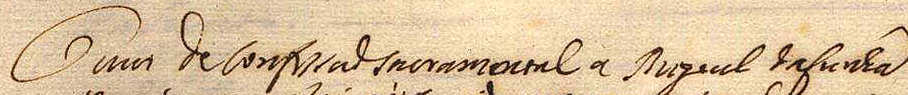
Ouui de confissaõ sacramental a Miguel da Cunha
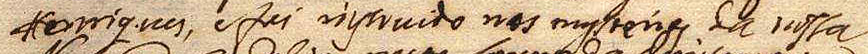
Henriques, e foi instruido nos mysterios da nossa
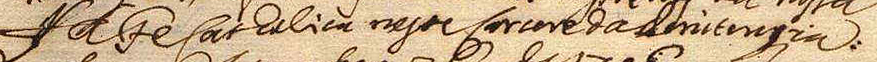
sta Fe Catholica neste Carcere da Penitensia:
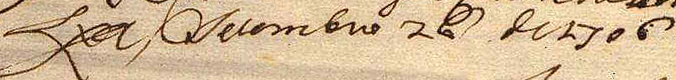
Lxa, Setembro 26 de 1706
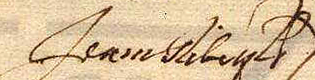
Joam RibeyRo
